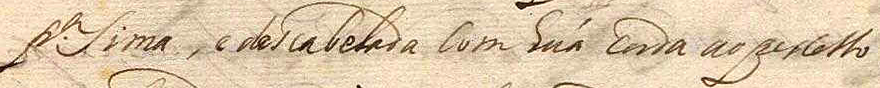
p.a sima, e descabelada com hūa corda ao pescosso
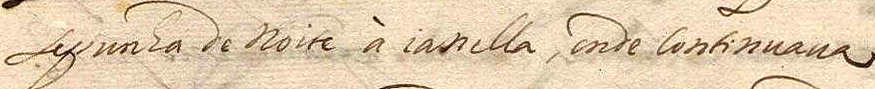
se punha de noite à ianella, onde continuaua
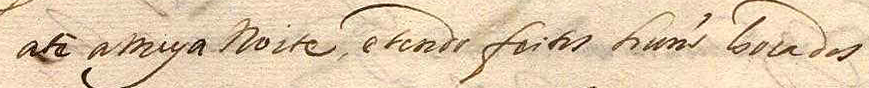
atè a miya noite, e tendo feitos huns bocados
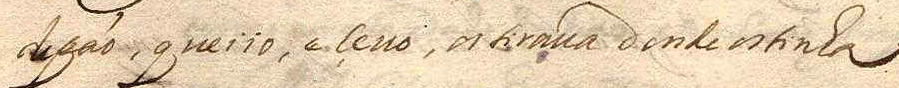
de paõ e queiio, e çeuo os tiraua donde os tinha
